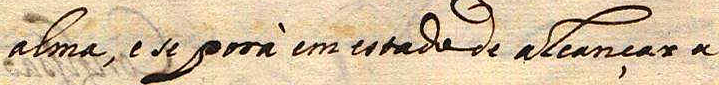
alma, e se porà em estado de alcançar a
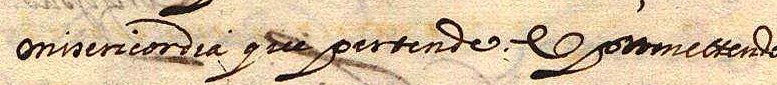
misericordia que pertende e promettendo
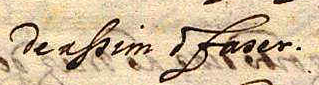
de assim o fazer.
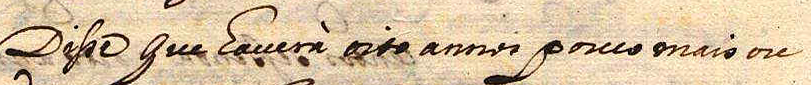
Disse que haverà oito annos pouco mais ou
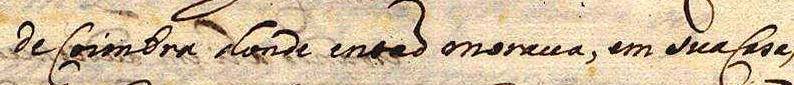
de Coimbra donde entaõ morava, em sua Casa
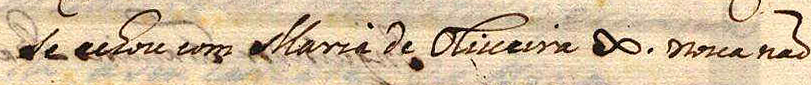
se achou com Maria de Oliveira x. nova naõ
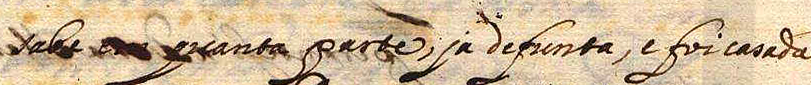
sabe em quanta parte, já defunta, e foi casada
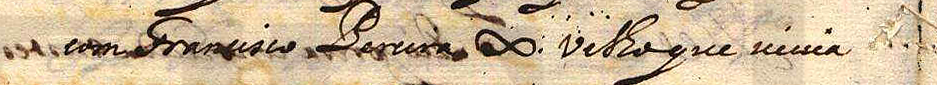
com Francisco Pereira x. velho que vivia
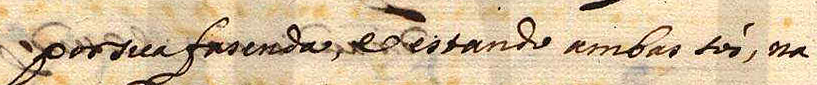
por sua fasenda, e estando ambas sós, na
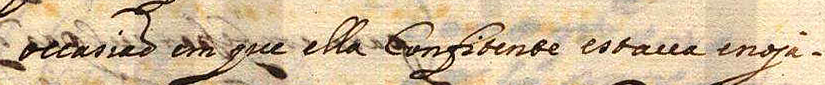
occasiaõ em que ella confitente estava enoja
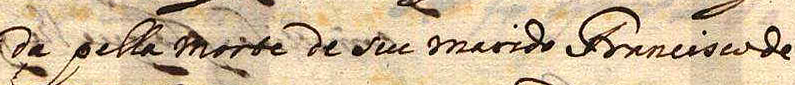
da pella morte de seu marido Francisco de
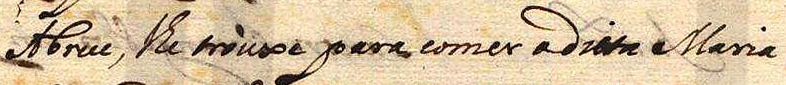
Abreu, lhe trouxe para comer a dieta Maria
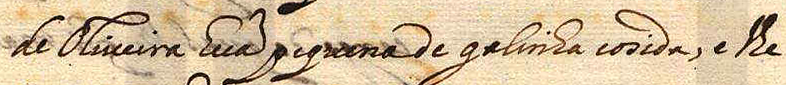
de Oliveira hūa pequena de galinha cosida, e lhe
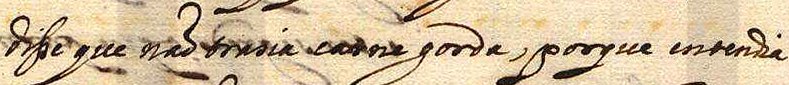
disse que naõ trasia carne gorda, porque entendia
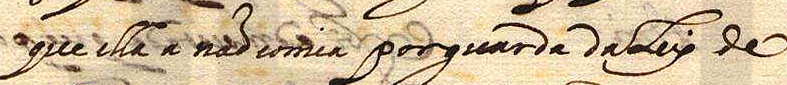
que ella a naõ comia por guarda da Lei de
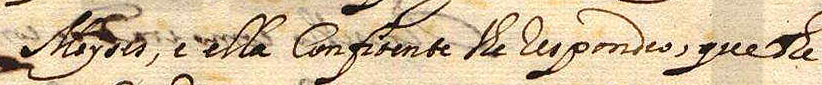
Moyses, e ella Confitente lhe respondeo, que lhe
